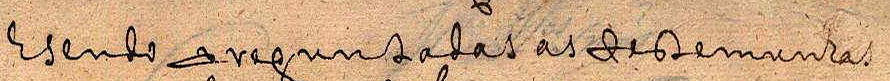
E sendo preguntadas as testemunhas
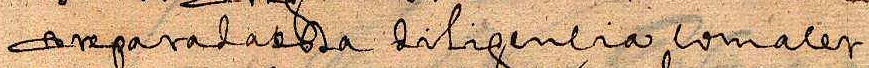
preparada esta diligencia com a cer
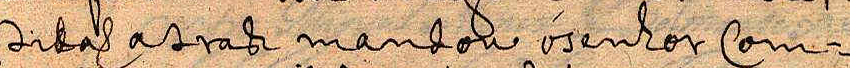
tidaõ atras mandou o senhor Com
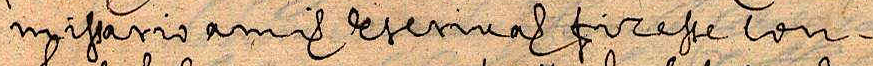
missario a mī Escriuaõ fizesse con
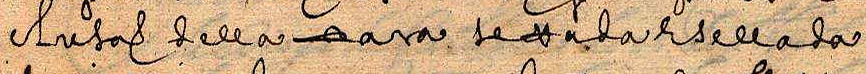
cluzaõ della para seRada E sellada
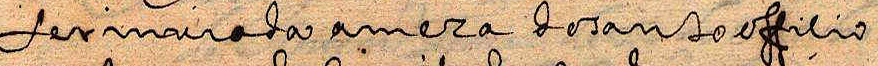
ser inuiada a meza do santo officio
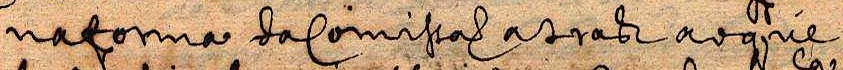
na forma da Comissaõ atras ao que
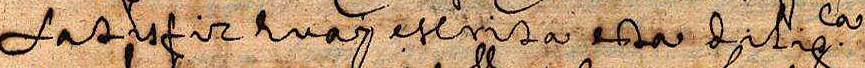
satisfiz E uaj escrita esta dilig.ca
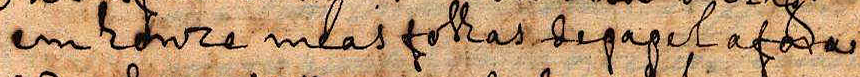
em honze meas folhas de papel afora
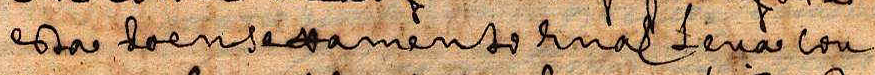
esta do enseRamento E naõ leua cou
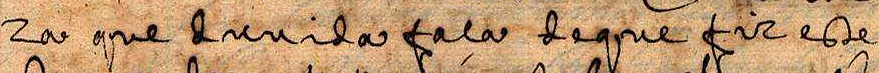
za que duvida faça de que fiz este
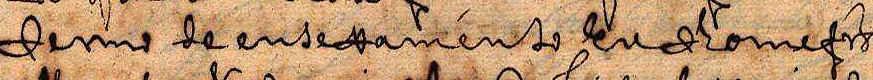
termo de enseRamento Eu thome frz̄
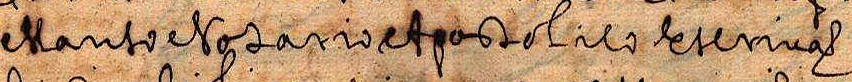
Manso Notario Apostolico Escriuaõ
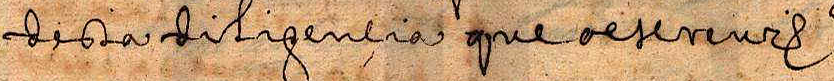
desta diligencia que o escreui
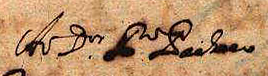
Ao D.or P.o Pacheco
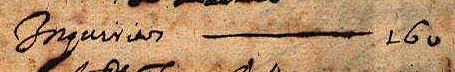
Jnquiritos - 160
